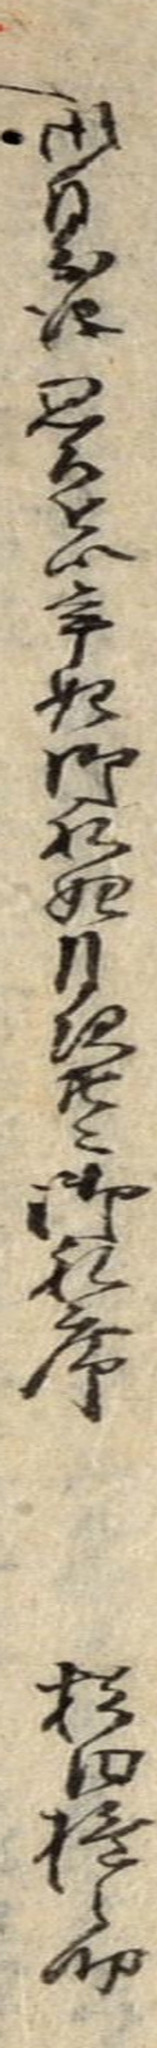御自分儀思召を以年始御礼月次共に御礼席杉田権之助

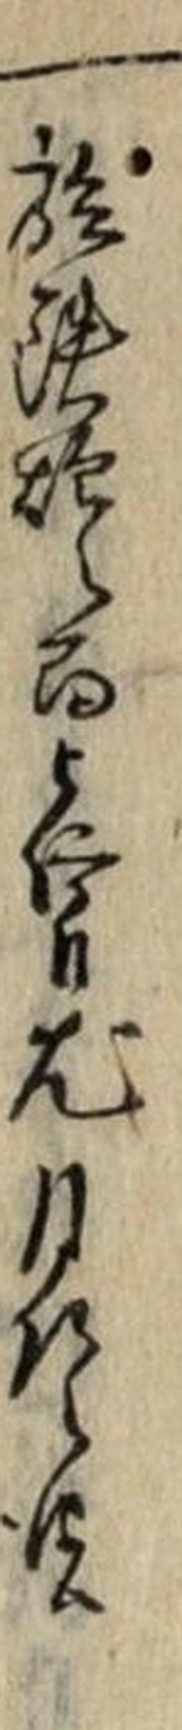於鉄砲之間被仰付尤月次之儀は
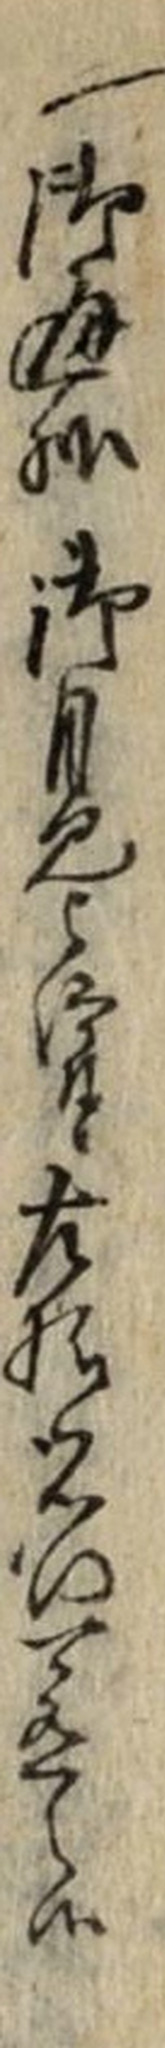御通掛御目見被仰付候左様御心得可有之候
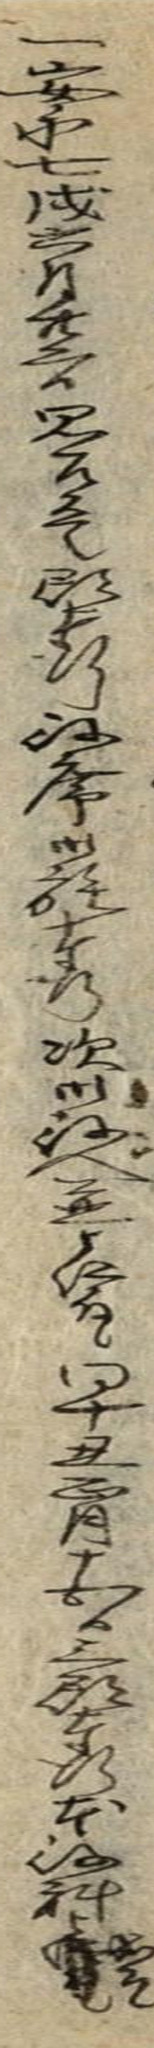一安永七戌六月廿二日思召有之郡奉行役席御旗奉行次御役人並被仰付候同十丑正月十五日三郡奉行本役料被成下候
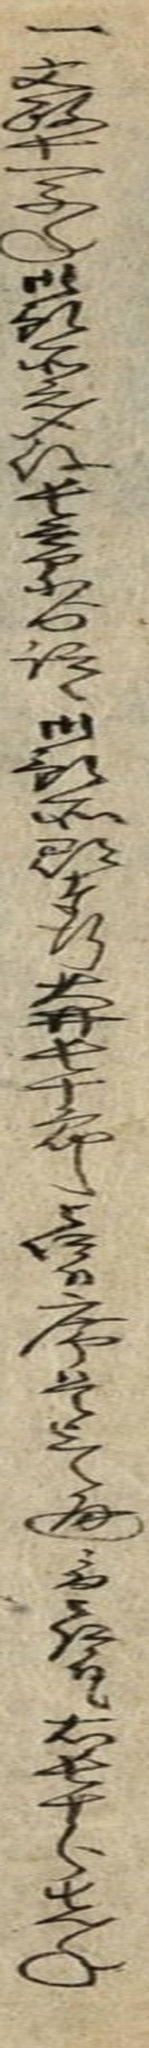一文政十一子年御預所元〆役長谷部小右衛門跡へ御預所郡奉行大井長十郎被仰付席是迄之通に而被仰付候右長十郎先年
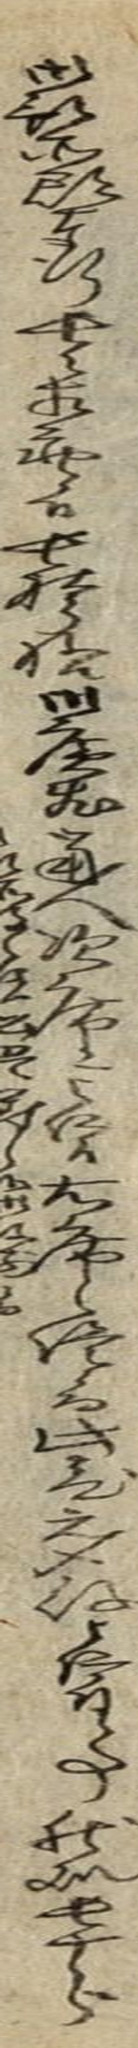御預所郡奉行長々相勤候付長袴格御広敷御用人次席に被仰付右席之侭に而此度元〆役被仰付候事然処長十郎
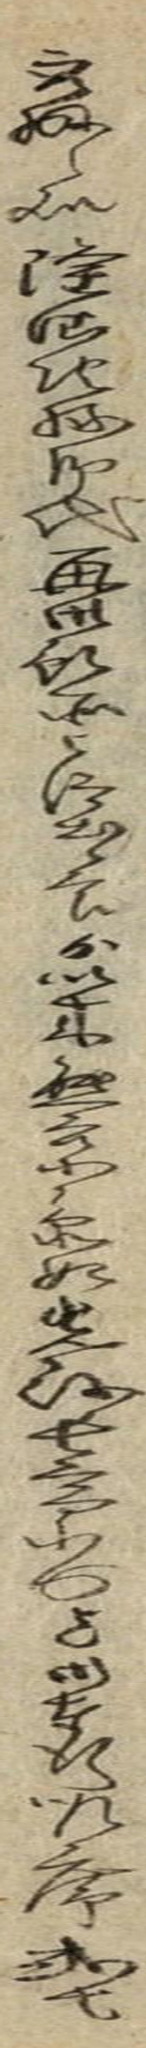取扱候処隆徳院様御代再御預所被仰出候節ゟ以来熊谷小兵衛始先役長谷部小右衛門迄御奉行順席或は
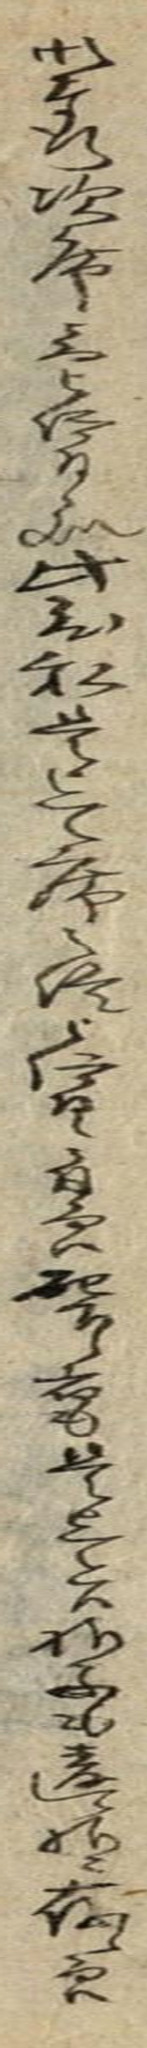御奉行次席に而被仰付候処此度私是迄之席之侭被仰付に付而は配下之者も是迄とは様子も違候様に存候而は
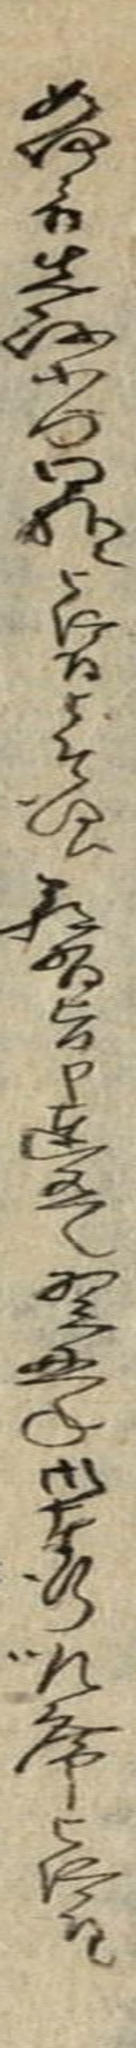如何に付先役小右衛門同様へ被仰付被下候得は難有旨申達有之翌丑年御奉行順席被仰付候
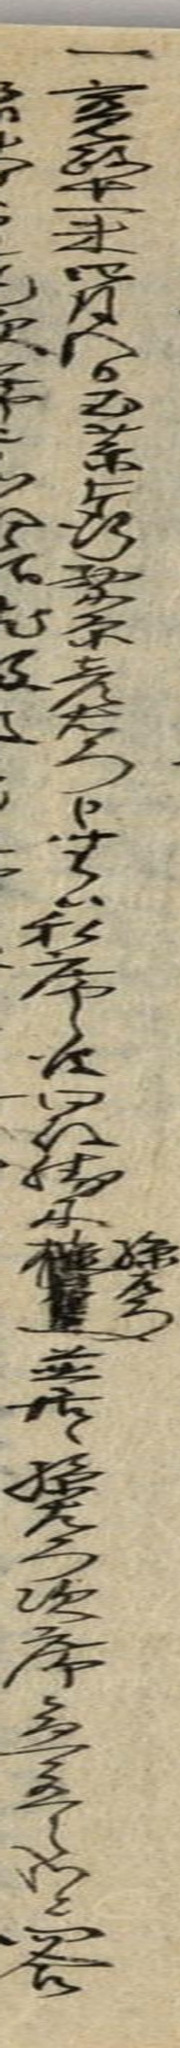一寛政十一未四月八日玉薬奉行栗原彦右衛門申聞候は私席之儀同役勝木孫左衛門並居候孫左衛門次席に而可有之候哉と問合
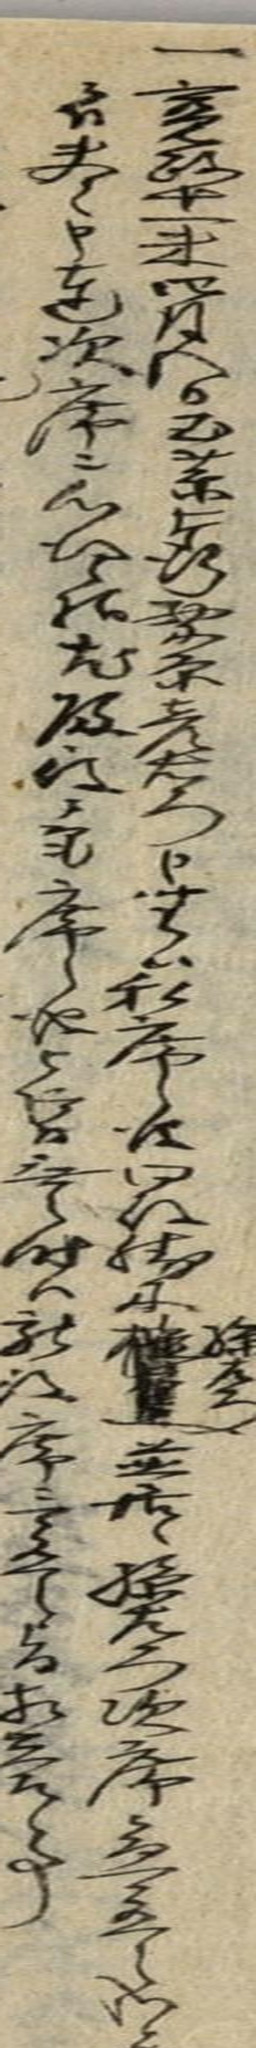に付夫々申達次席に心得候様尤帰役に而も席之儀被仰付無之時は新役席に可有之候旨相答候事
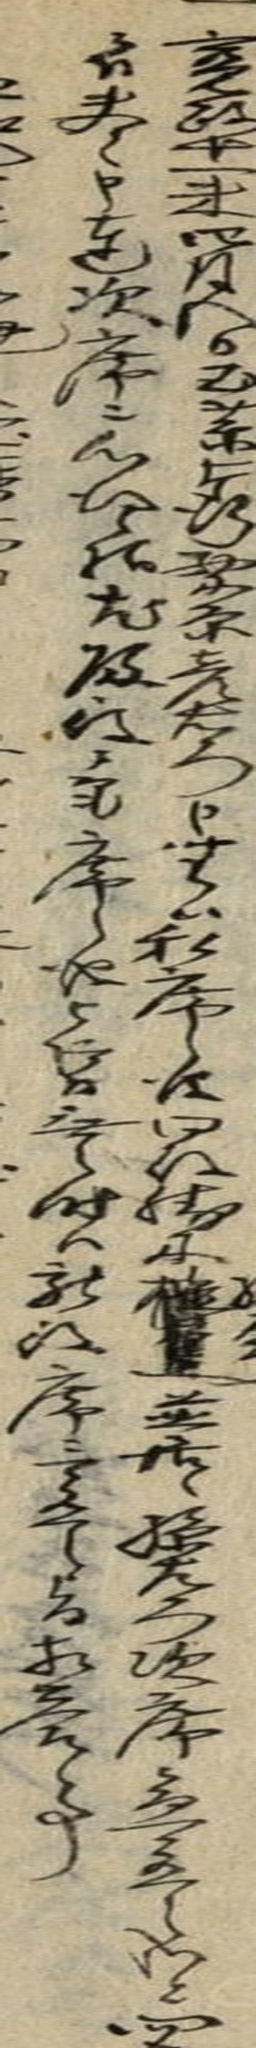に付夫々申達次席に心得候様尤帰役に而も席之儀被仰付無之時は新役席に可有之候旨相答候事
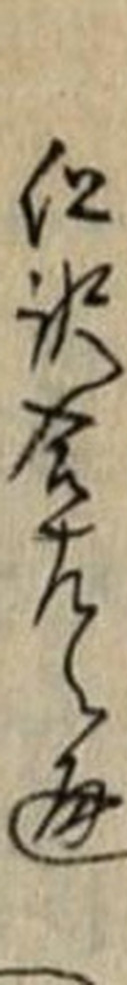但訳合左之通
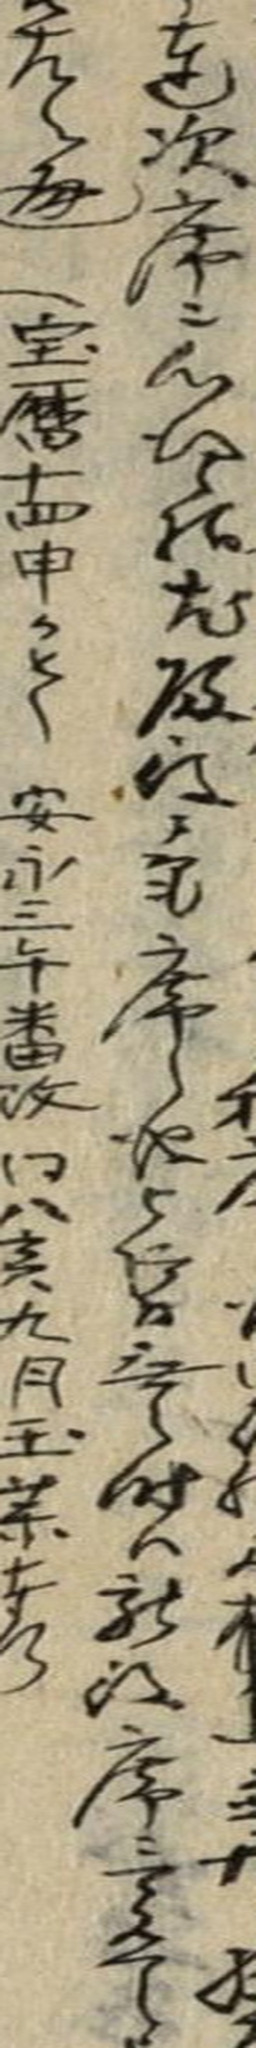宝暦十四申之かとく安永三午番改同八亥九月玉薬奉行
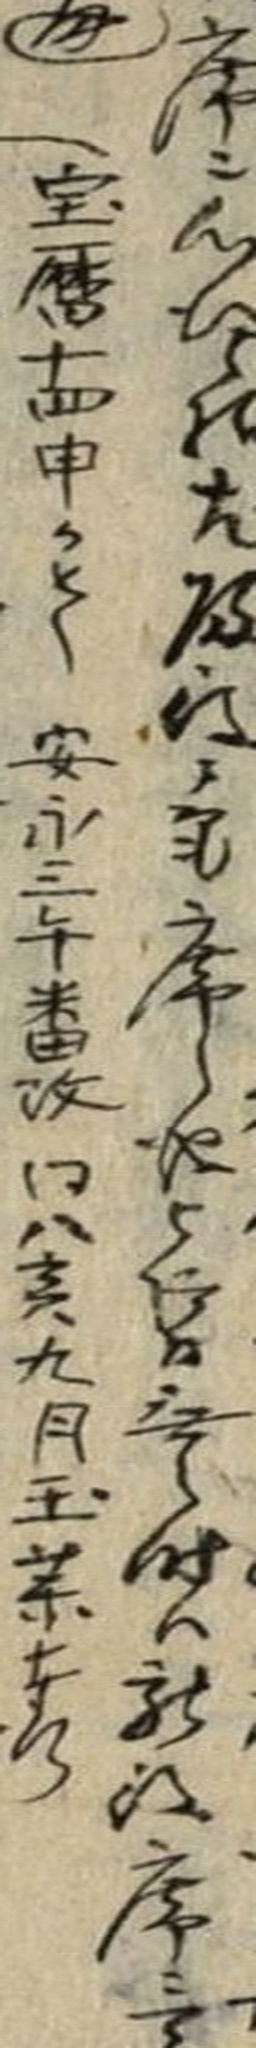宝暦十四申之かとく安永三午番改同八亥九月玉薬奉行
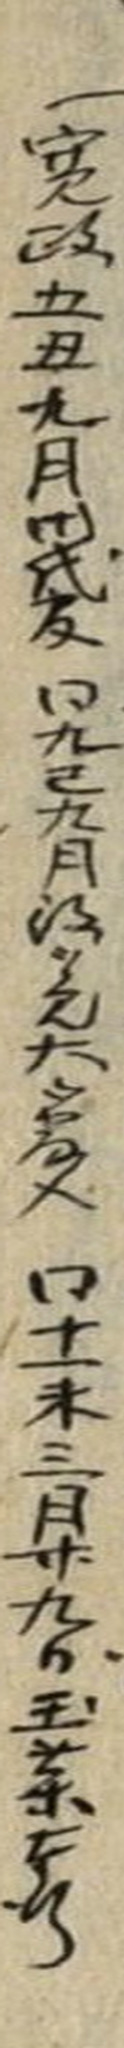寛政五丑九月御代官同九巳九月役御免大御番入同十一未三月廿九日玉薬奉行
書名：御用并被仰出之部
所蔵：福井県文書館 Fukui Prefectural Archives
